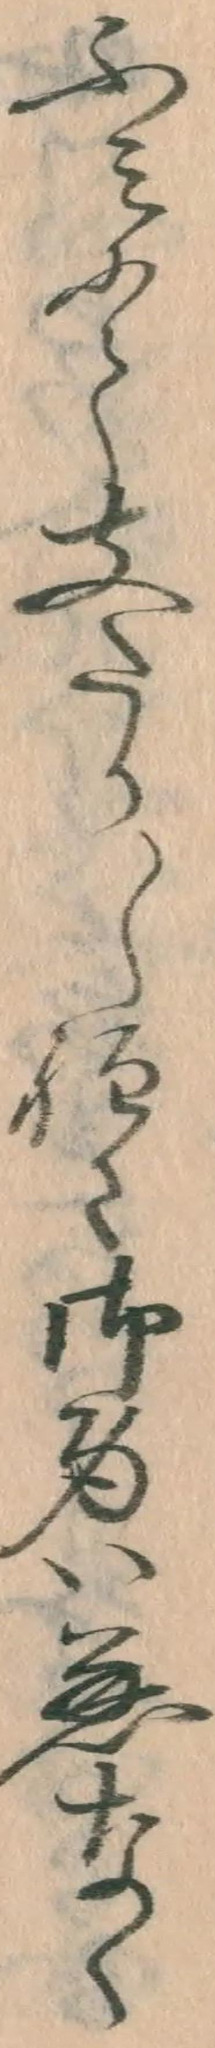ふミにて支たりし程に御身は恙なく
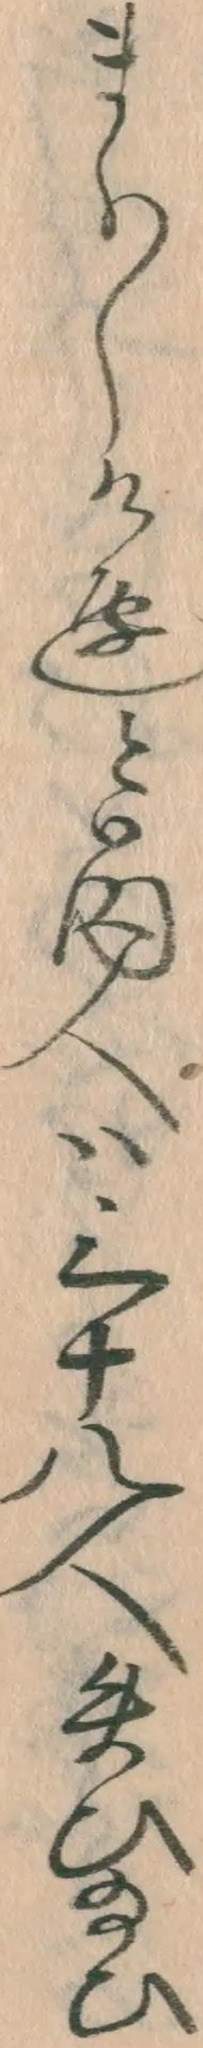まし〳〵けれと御内人ハ三十八人失ひ玉ひ
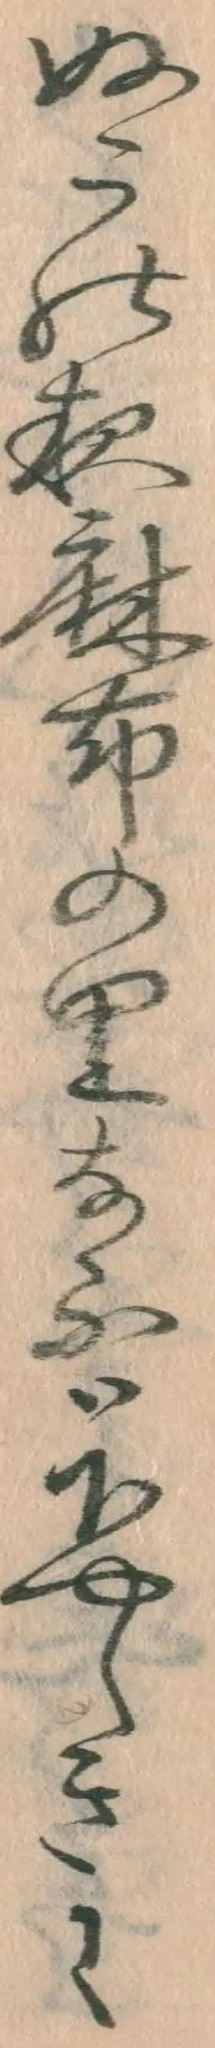ぬこの夜麻布の里なる御下やしきに
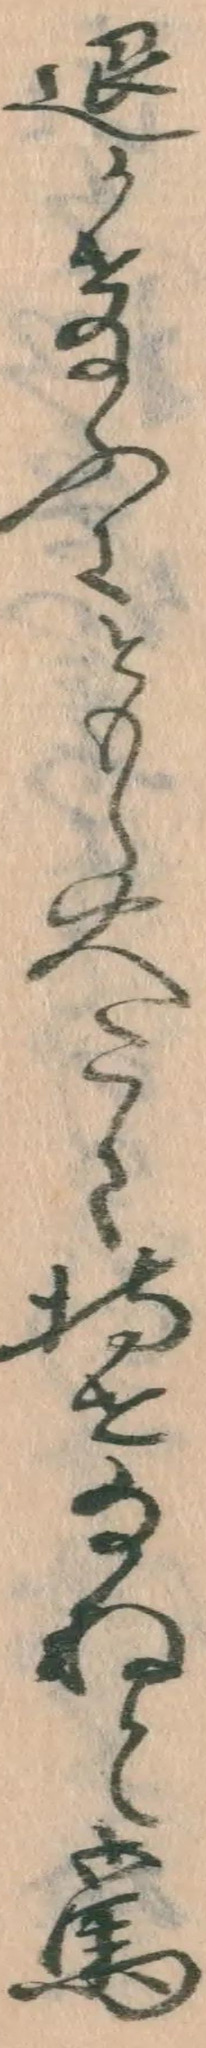退かせ玉ふにともし火たに持せ玉ねと御馬
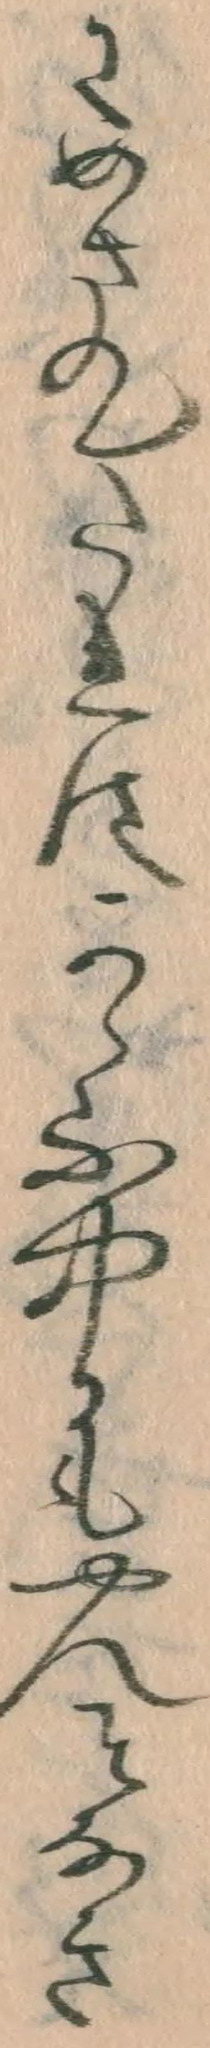にめされたれはかゝる中にもやんことなき
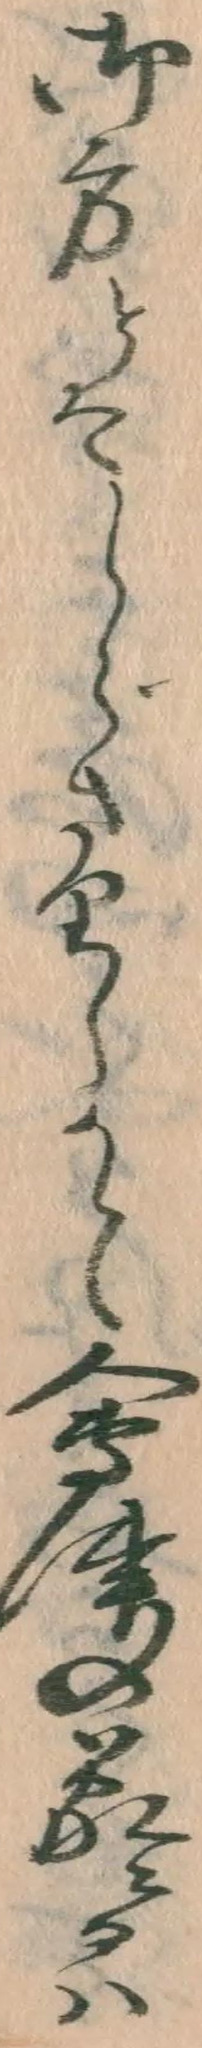御方とはしらさりしかと會津の御家ニ而ハ
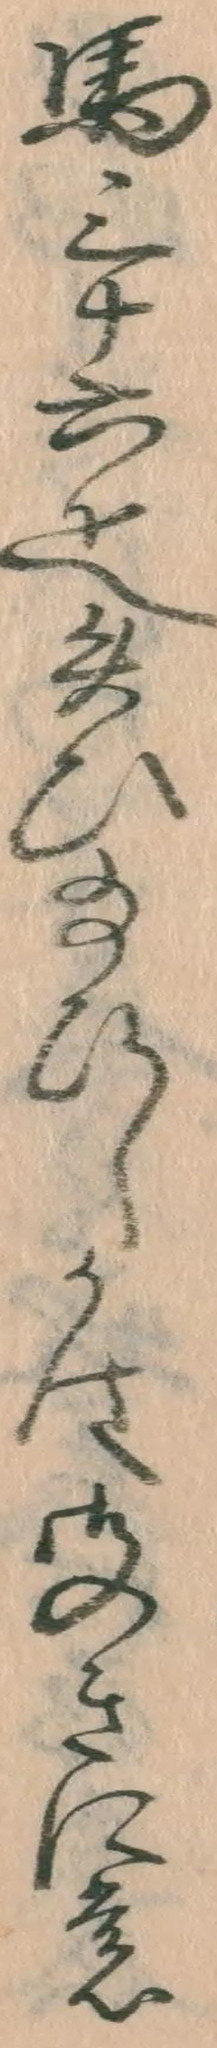馬三十六疋失ひ玉ひしかは御のきにも
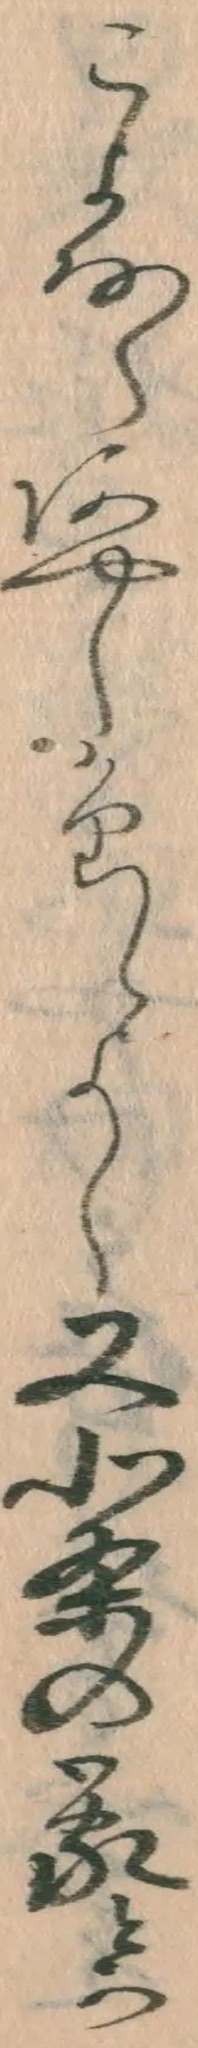こよなくあやしかりしよし又北条の御家とか
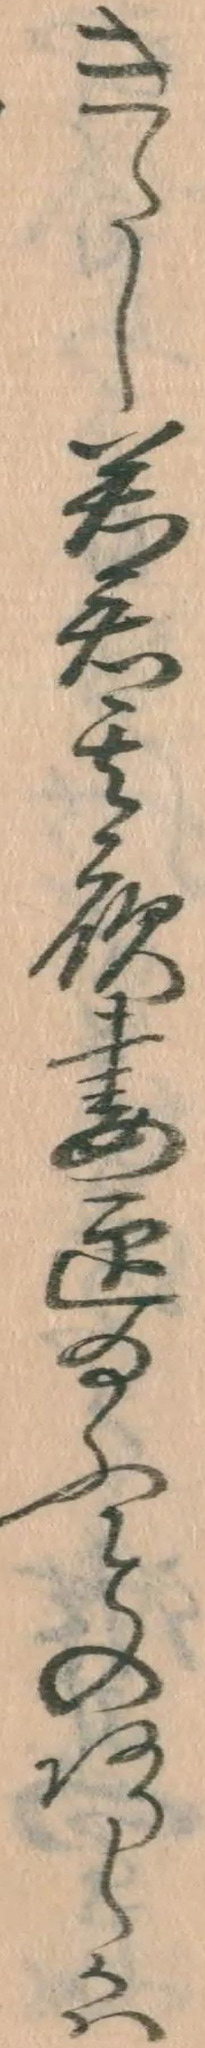きゝし若君其夜妻迎玉ふことのありしかハ
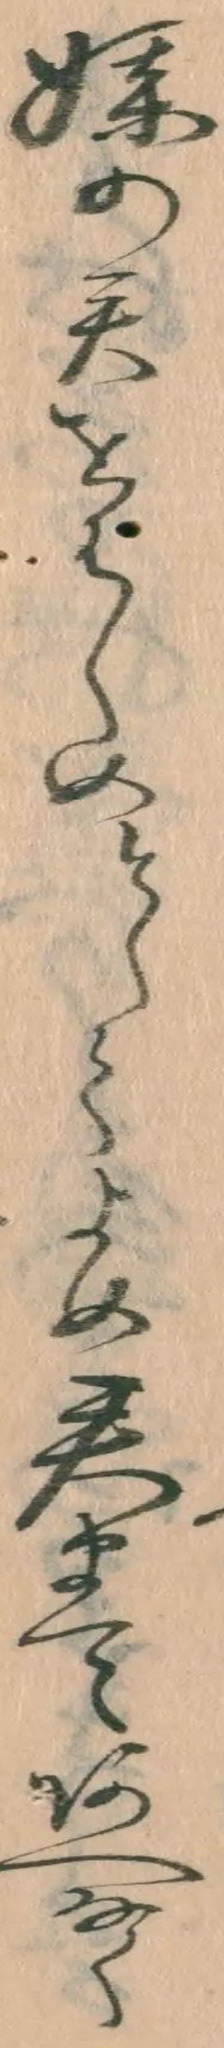媒の君をはしめとしてよめ君まてあへなく
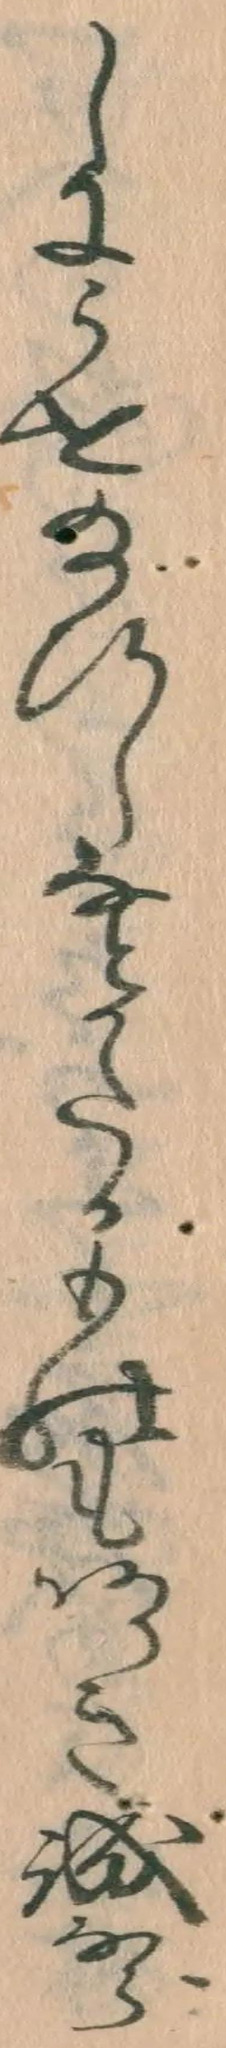しにうせ玉ひしなとかたるものもありき誠なら
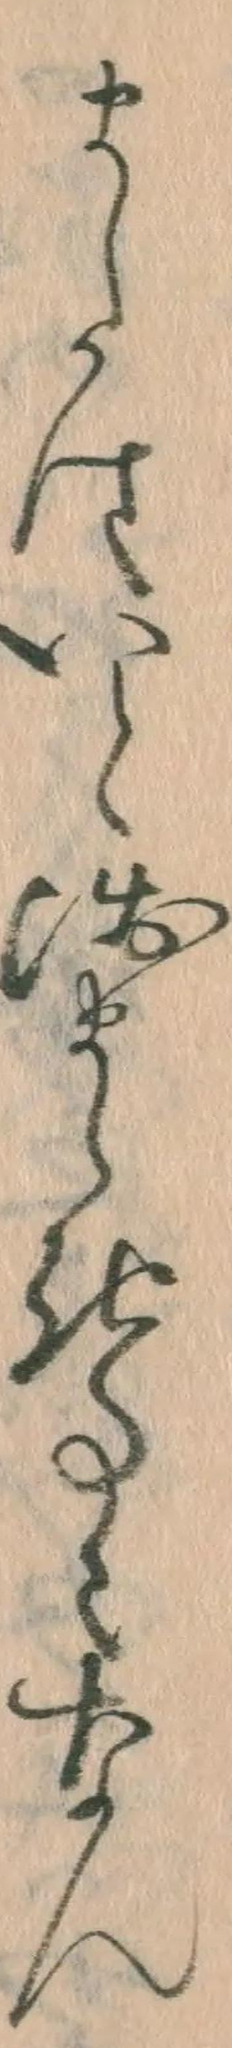ましかはいと浅ましき事ニなん
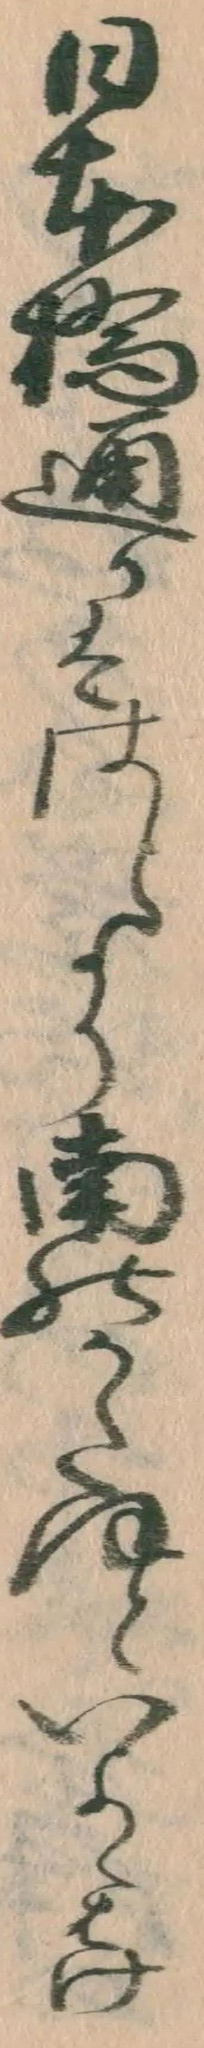日本橋通りははしより南のかたほといよ〳〵はけ
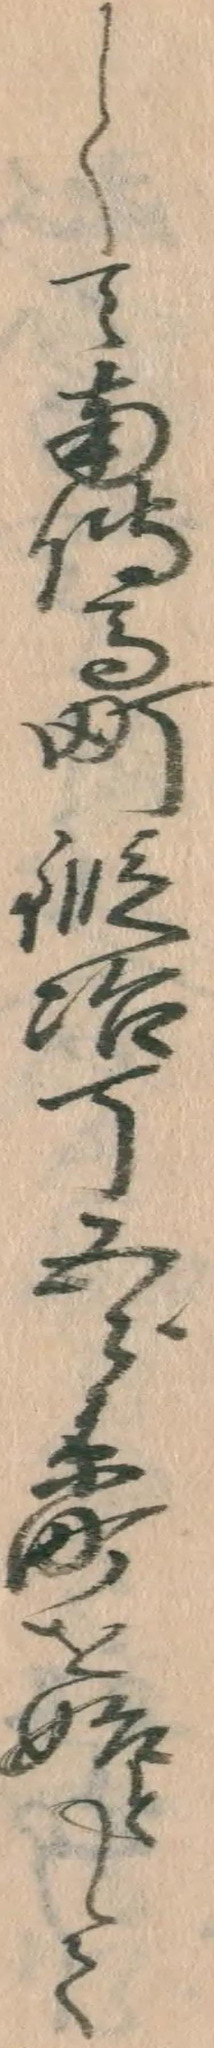しくて南伝馬町鍛冶丁五郎兵衛町を始として
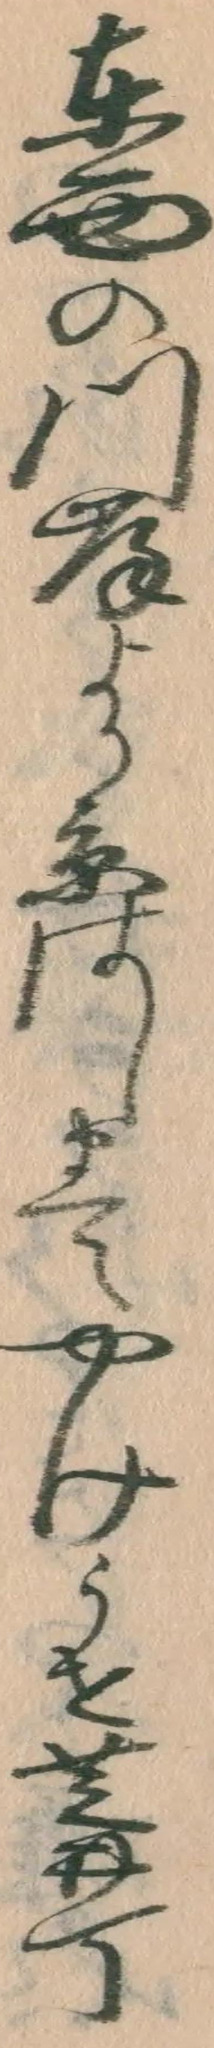東西の川岸より京はしまてやけうせ芝井丁
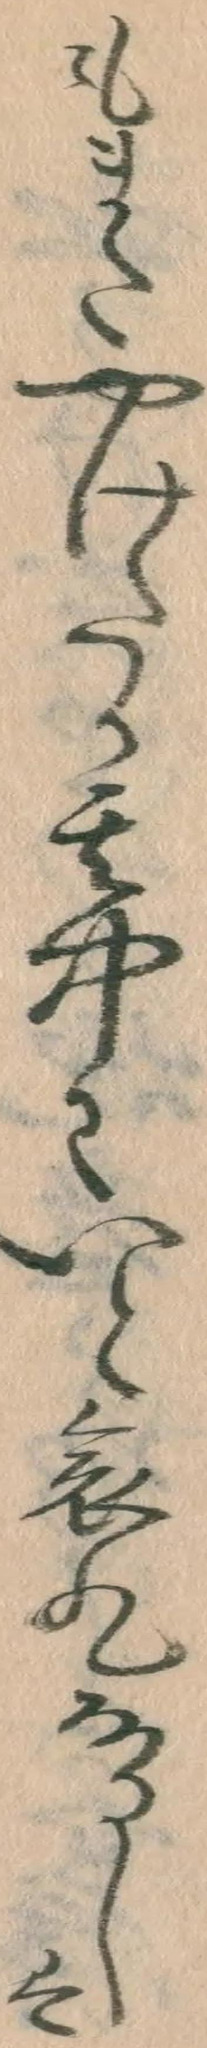もまたやけたり其中にいと哀れなりしは
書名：麗斎叢書. 20
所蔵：国立国会図書館 National Diet Library, JAPAN
